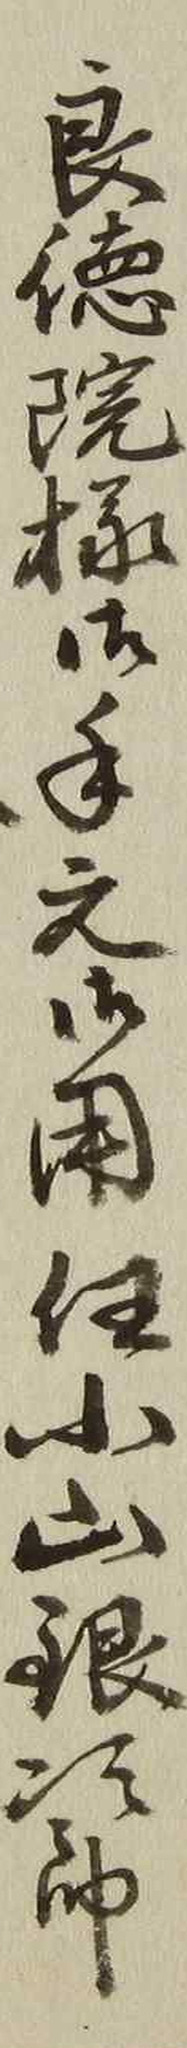良徳院様御手元御用任小山銀次郎
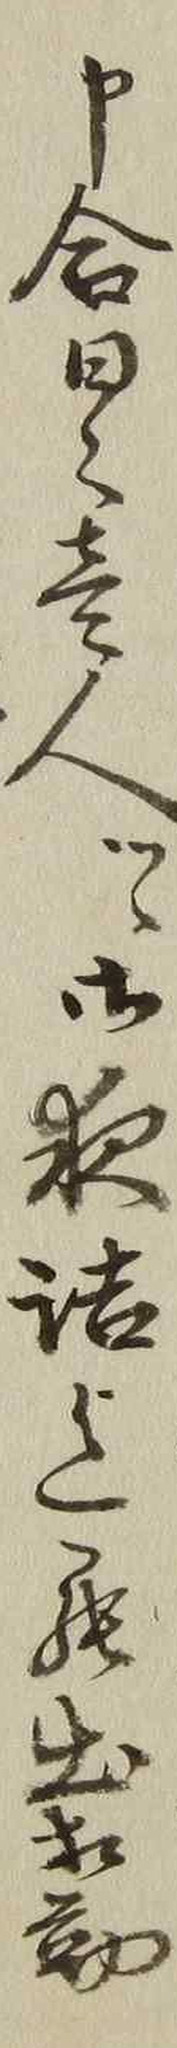申合日々壱人ツヽ御夜詰迄罷出相勤
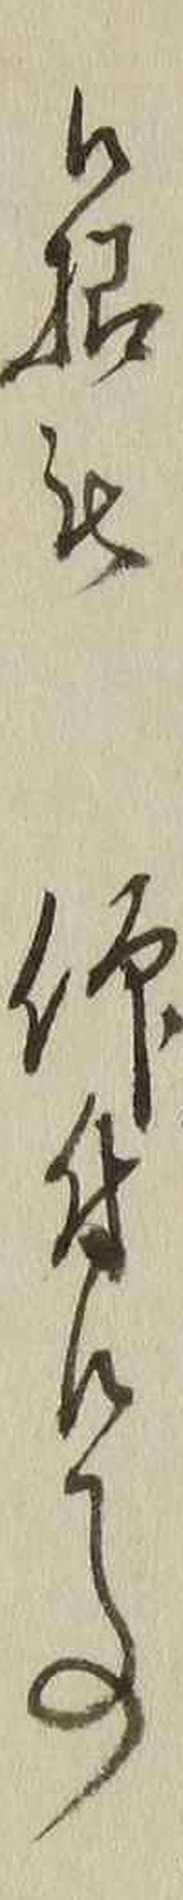候様被仰付候事
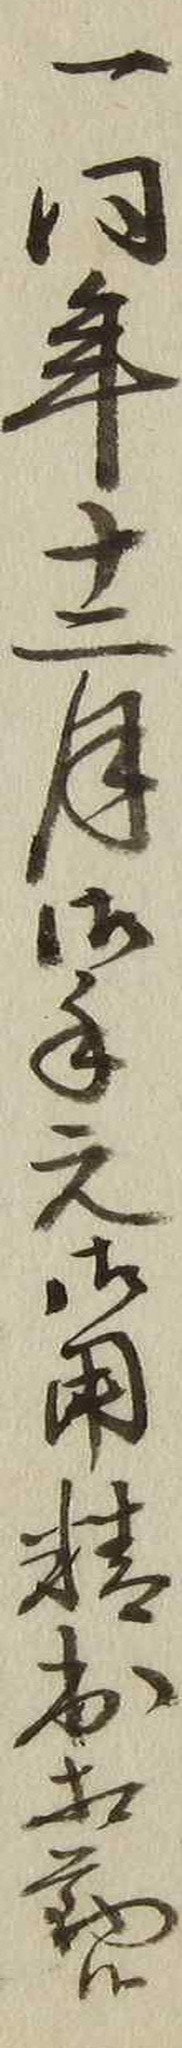一同年十二月御手元御用精出相勤候
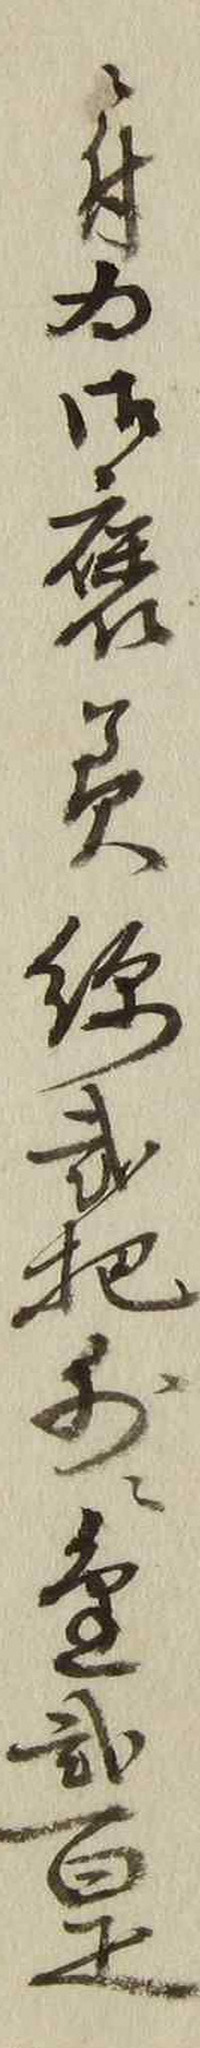ニ付為御褒美綿弐把外ニ金弐百疋
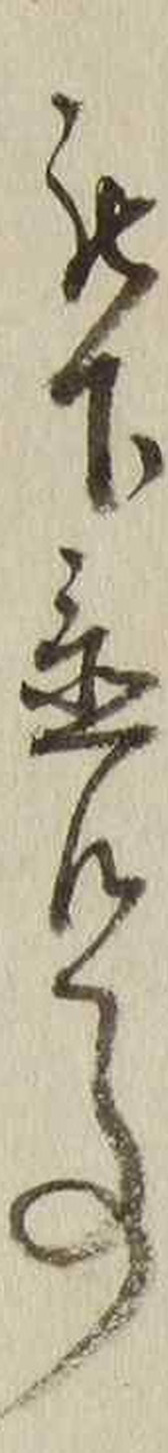被下置候事
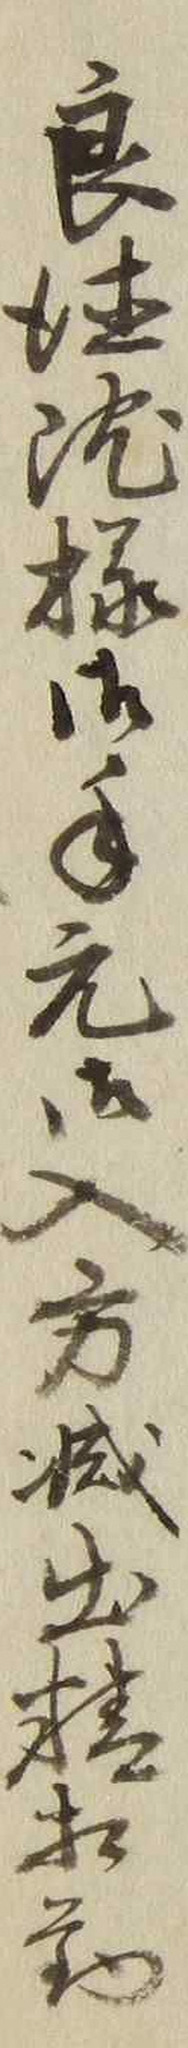良徳院様御御手元御入方減出精相勤
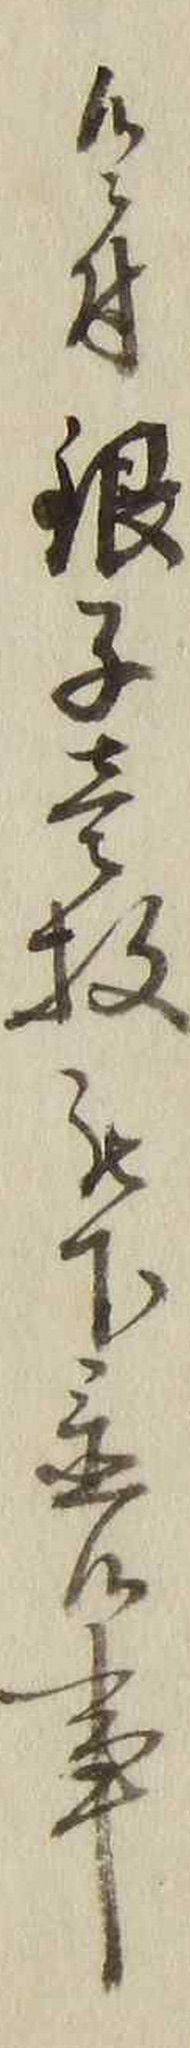候ニ付銀子壱枚被下置候事

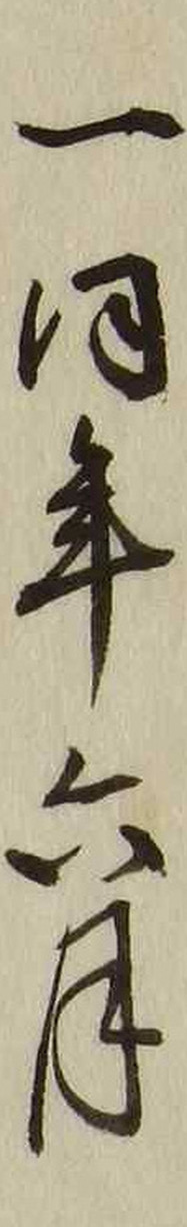一同年六月
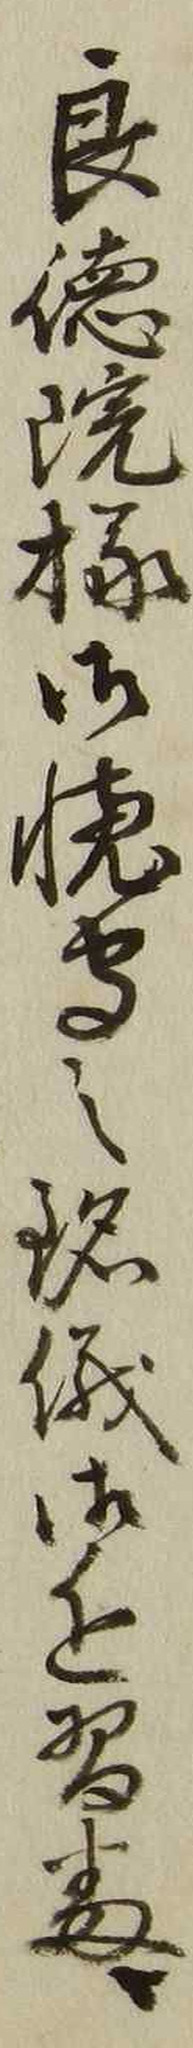良徳院様御懐守之銘儀御近習番ニ
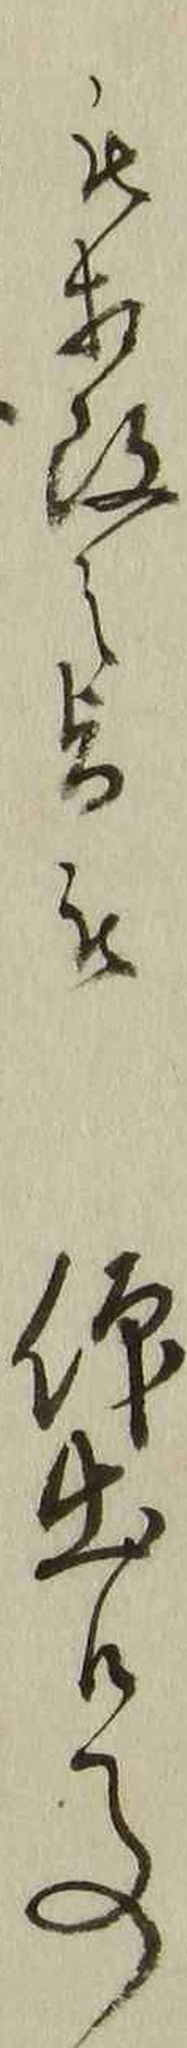被相改之旨被仰出候事
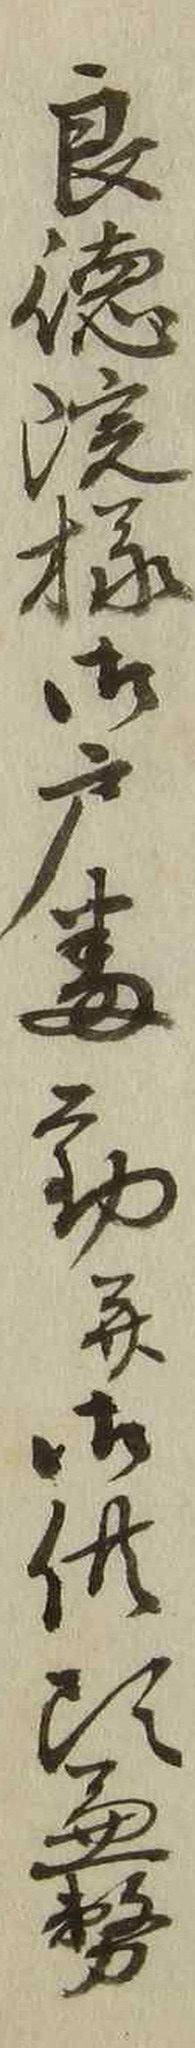良徳院様御戸番勤并御供頭兼務
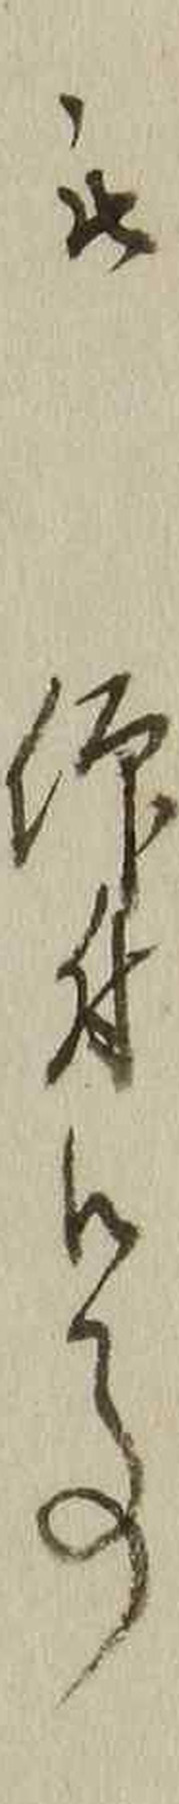被仰付候事
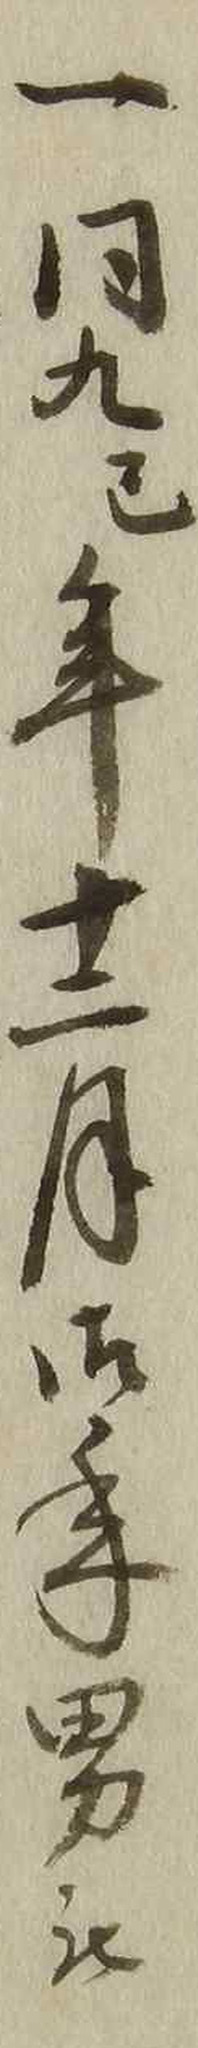一同九巳年十二月御年男被
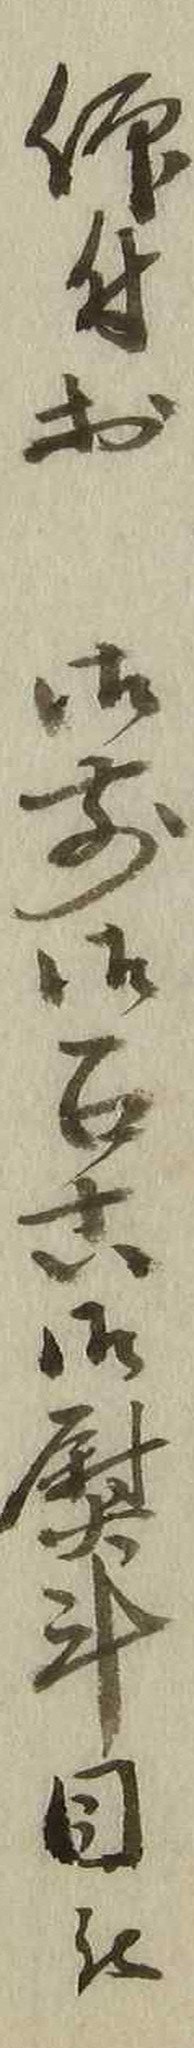仰付於御前御召古御熨斗目被
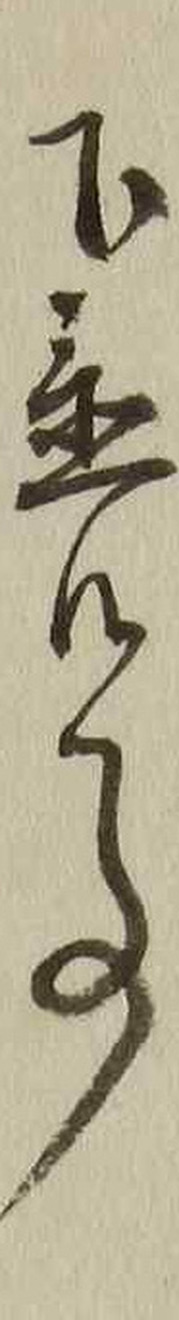下置候事
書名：諸士系譜　巻之31　い之部31
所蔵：会津若松市立会津図書館
